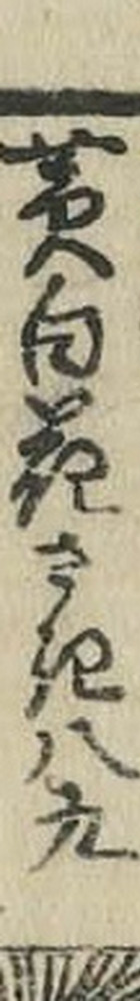黄白花さき八九
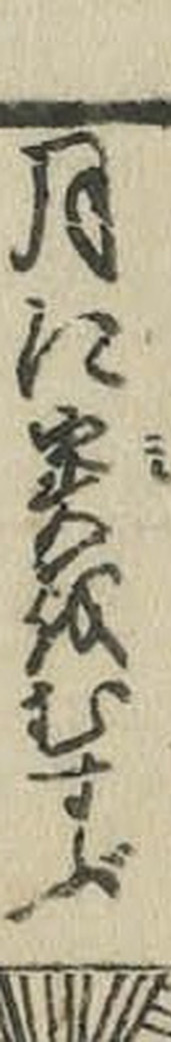月に実をむすぶ
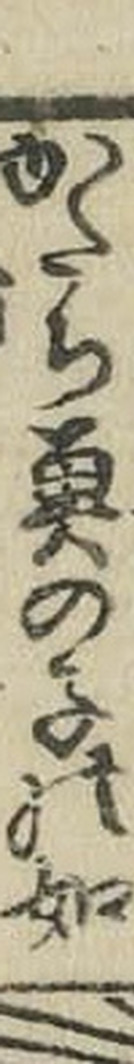かたち魚の子の如
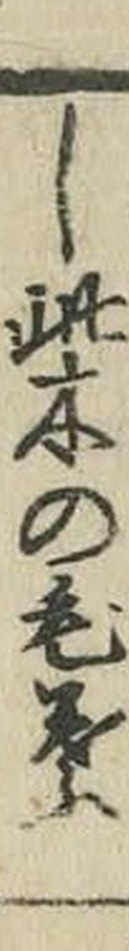し此木の毛葉
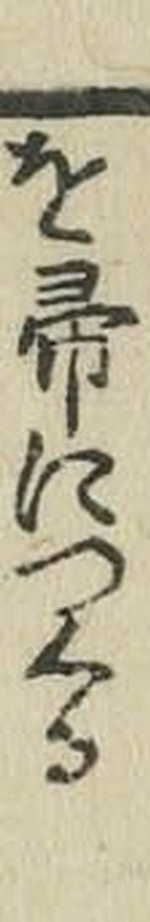を帚につくる
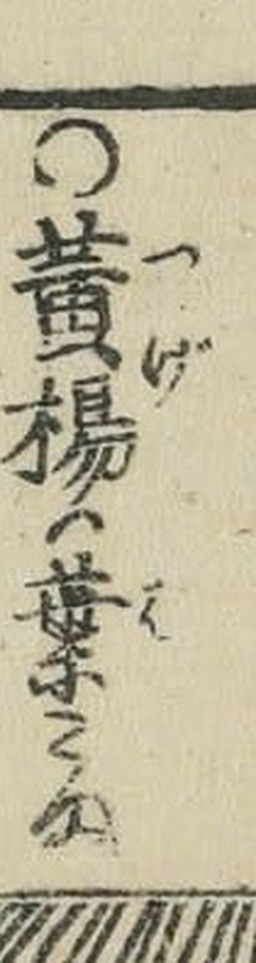○黄楊は葉こま
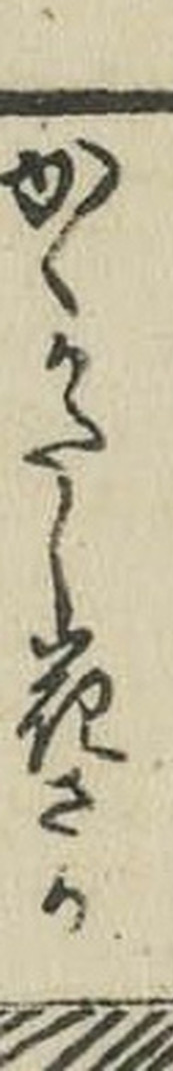かくかたし花さか
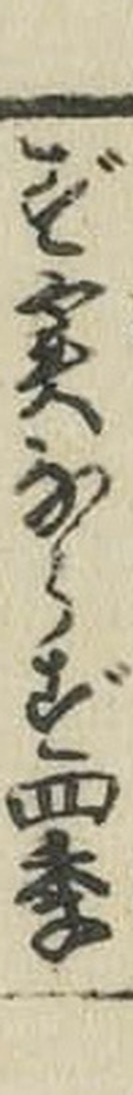ず実ならず四季
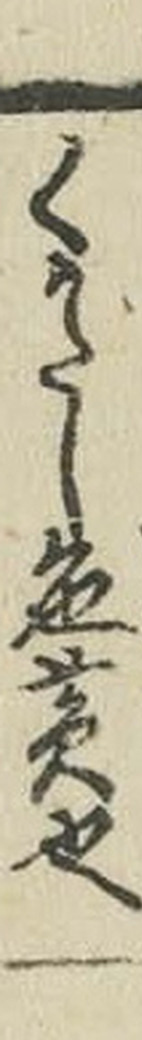くかたし色黄也
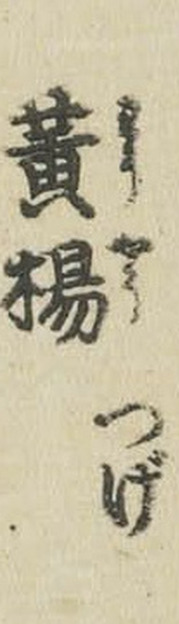黄楊つげ
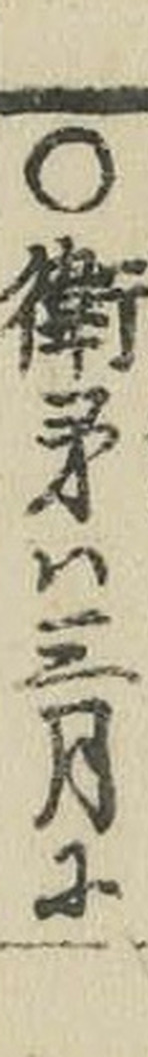○衛矛は三月に
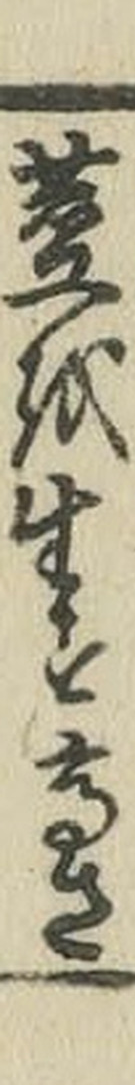茎を生す高さ
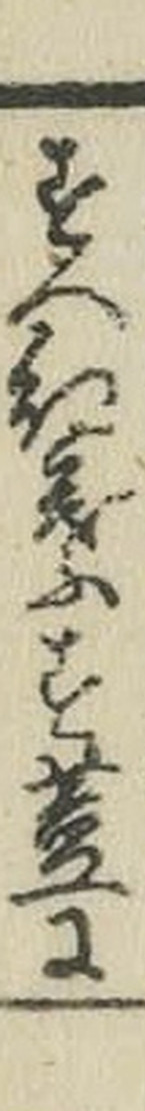すへ紅葉す茎に
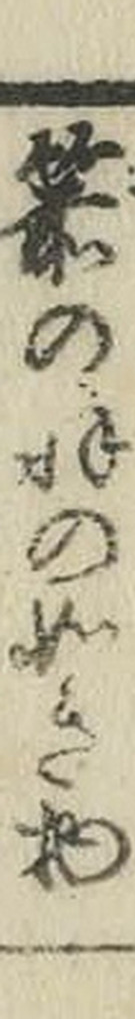箭の羽の如き物
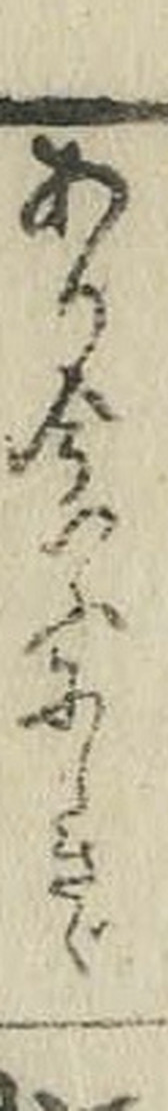あり今いふにしきゞ
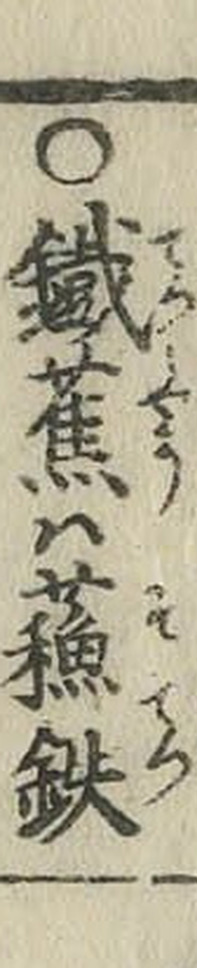○鉄蕉は蘇鉄
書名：増補頭書訓蒙図彙大成 10巻 8:巻之17-19
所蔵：東京学芸大学教育コンテンツアーカイブ
